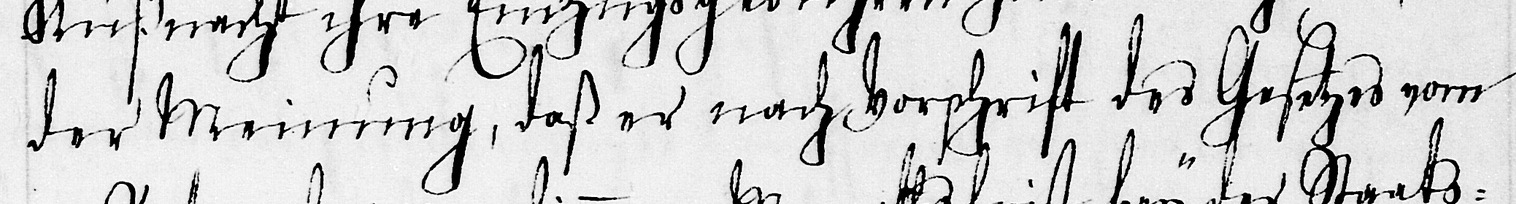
der Meinung, daß er nach Vorschrift des Gesetzes vom
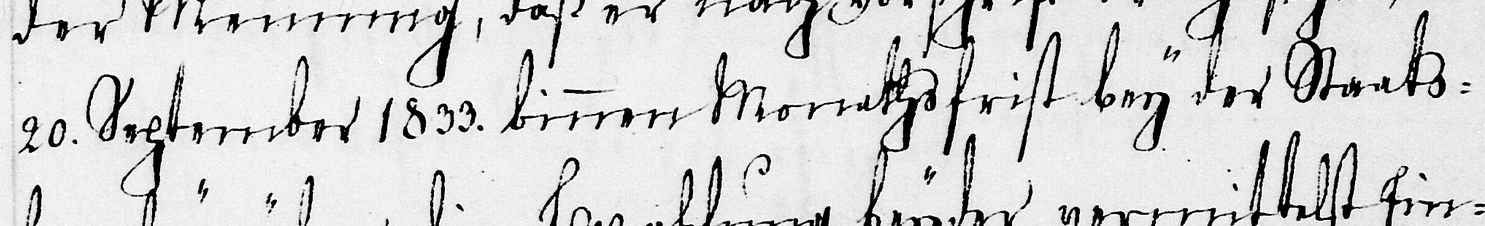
20. September 1833. binnen Monathsfrist bey der Staats¬
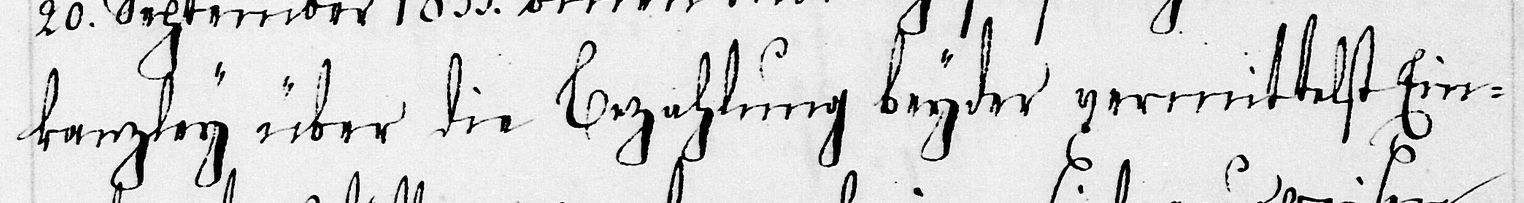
kanzley über die Bezahlung beyder vermittelst Ein¬
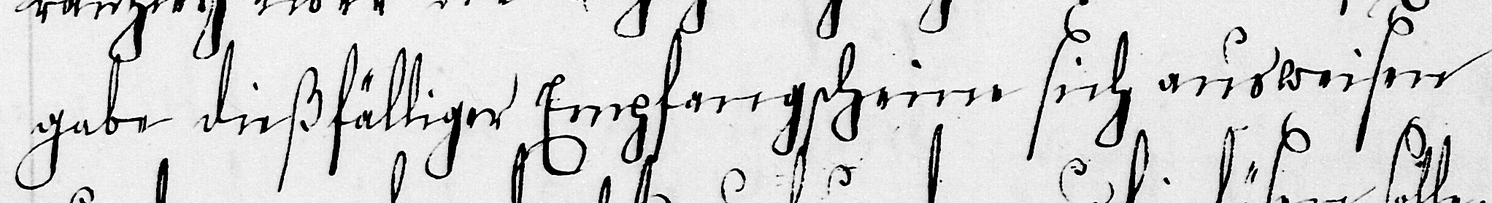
gabe dießfälliger Empfangsscheine sich ausweisen
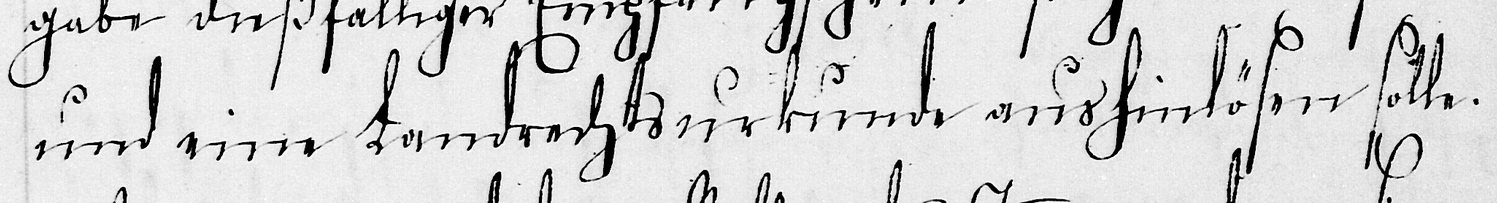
und eine Landrechtsurkunde aushinlösen sol¬
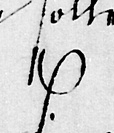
le.
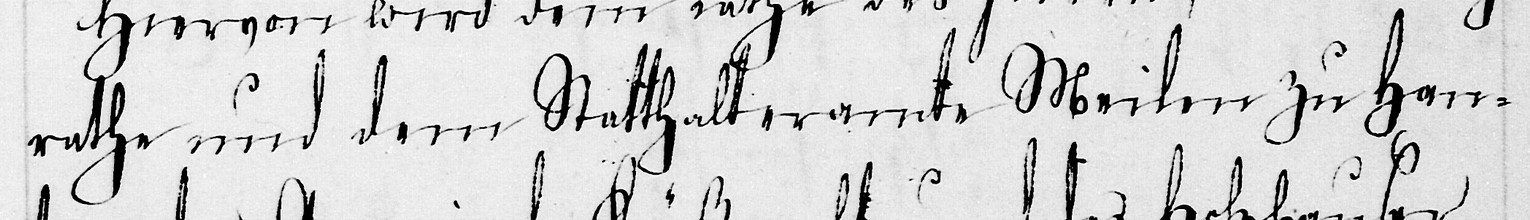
rathe und dem Statthalteramte Meilen zu Han¬
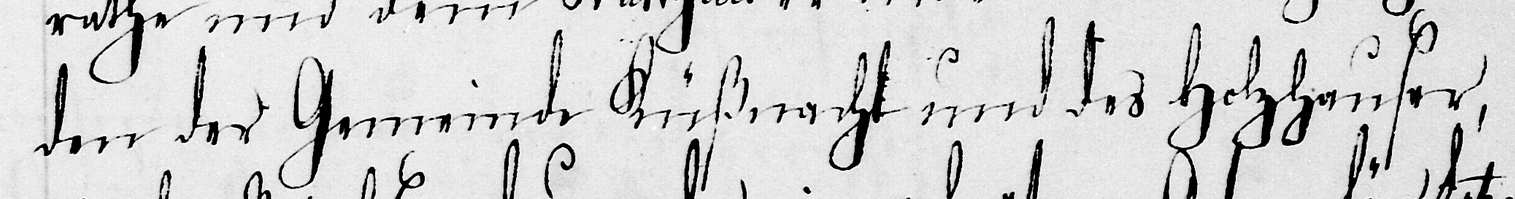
den der Gemeinde Küßnacht und des Holzhauser,
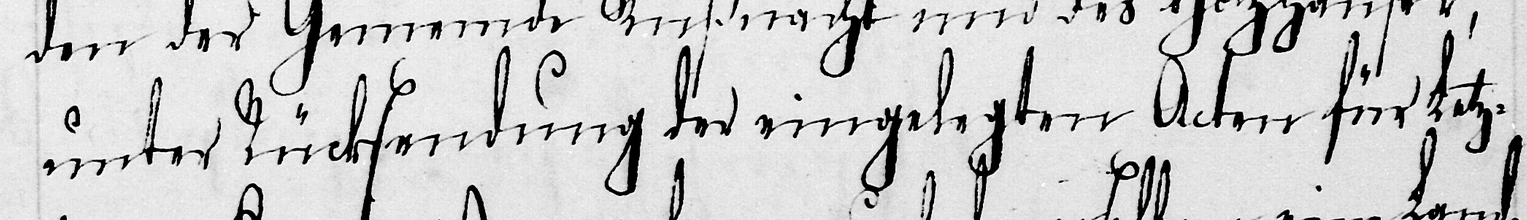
unter Rücksendung der eingelegten Acten für Let¬
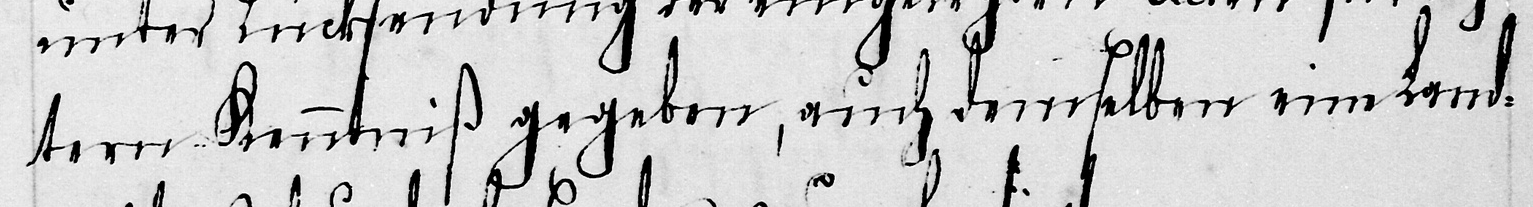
ztern Kenntniß gegeben, auch demselben eine Land¬
